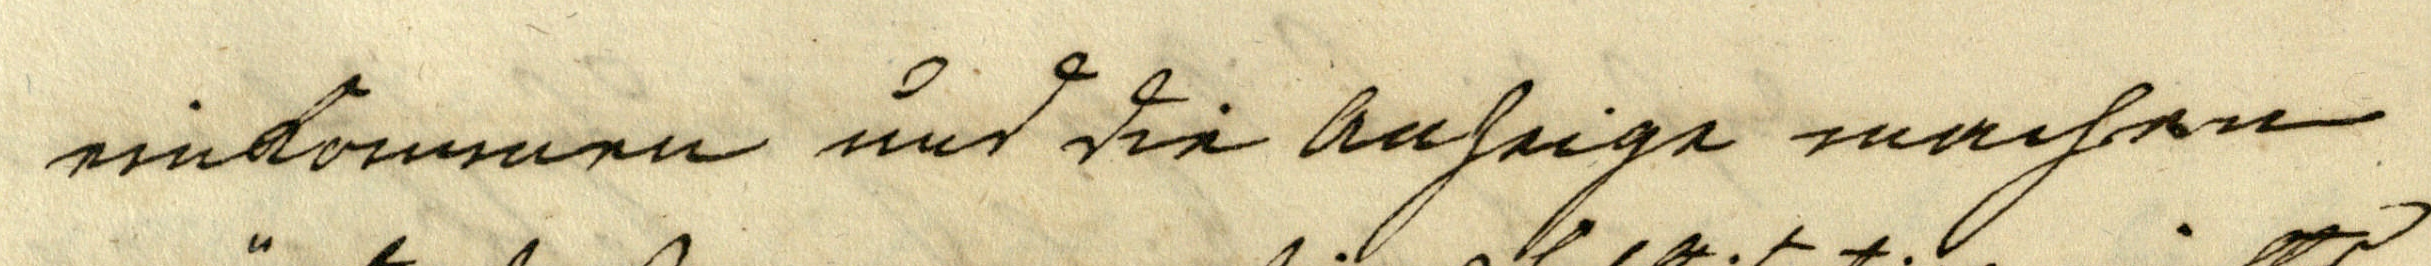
einkommen und die Anzeige machen
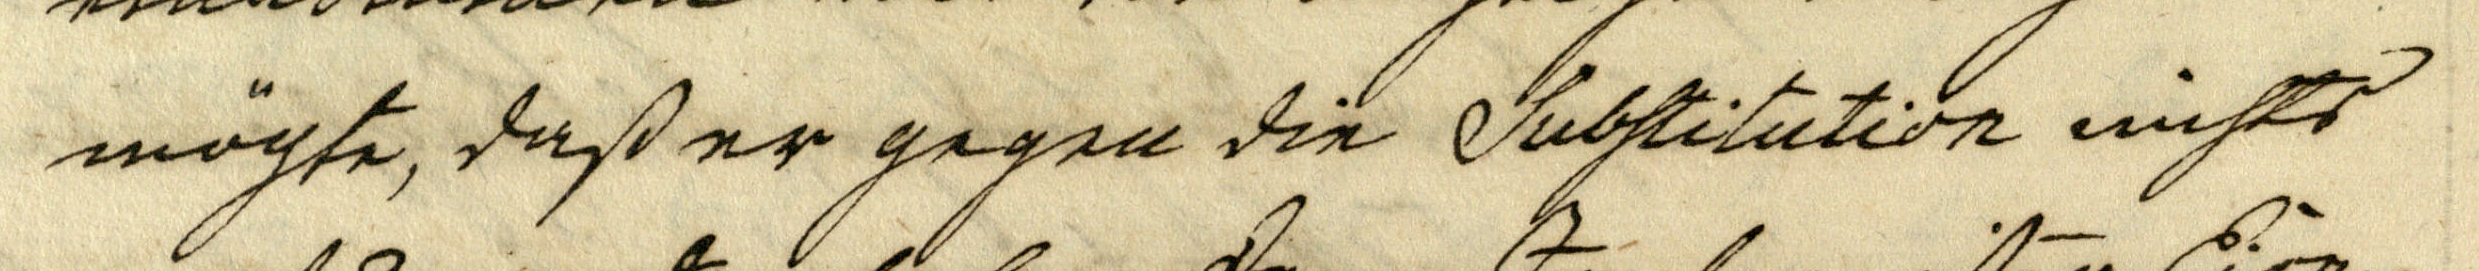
mögte, daß er gegen die Substitution nichts
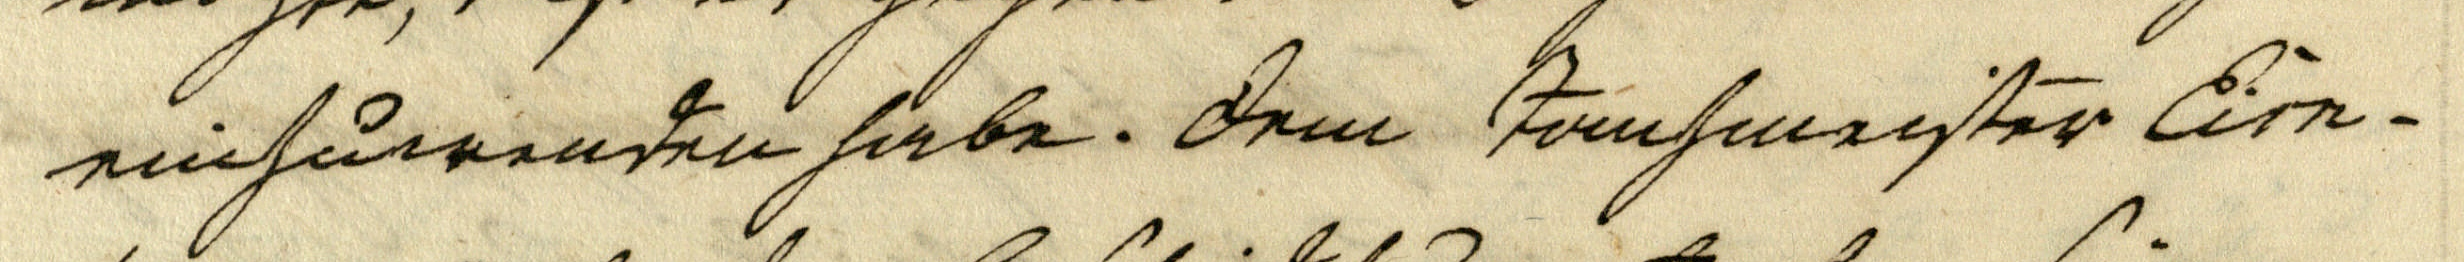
einzuwenden habe. Dem Tanzmeister Eim-
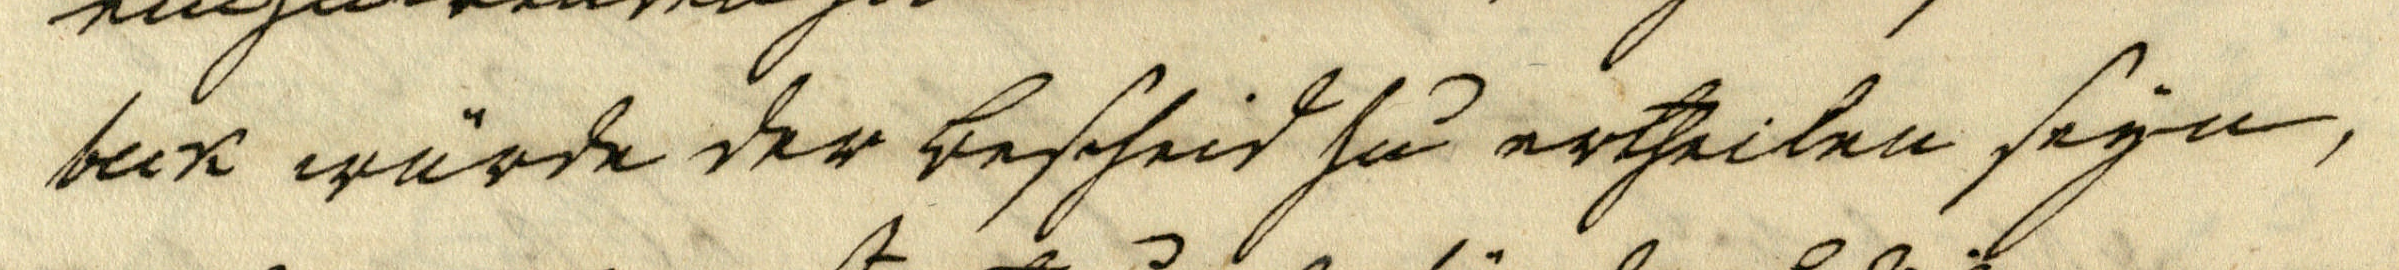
beck würde der Bescheid zu ertheilen seyn,
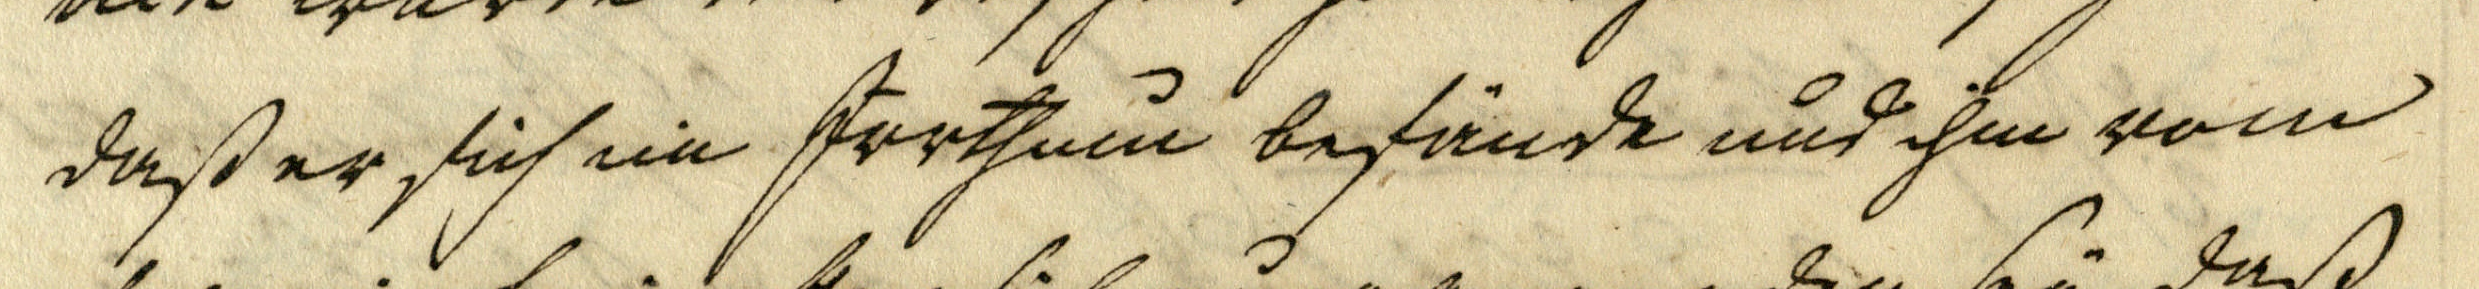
daß er sich im Irrthum befände und ihm vom
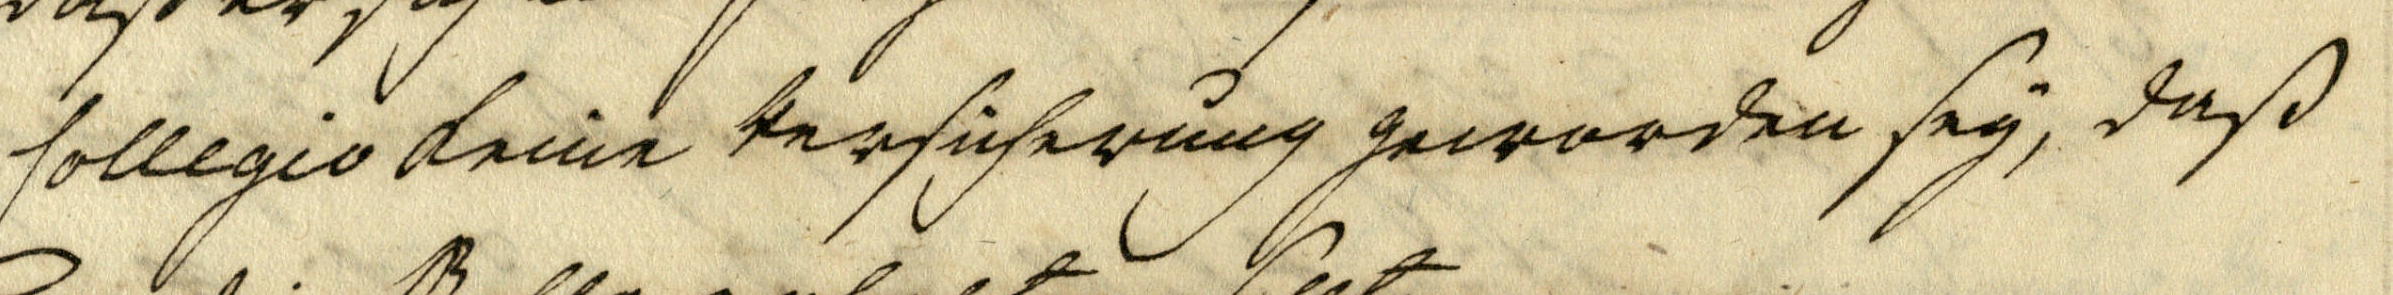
Collegio keine Versicherung geworden sey, daß
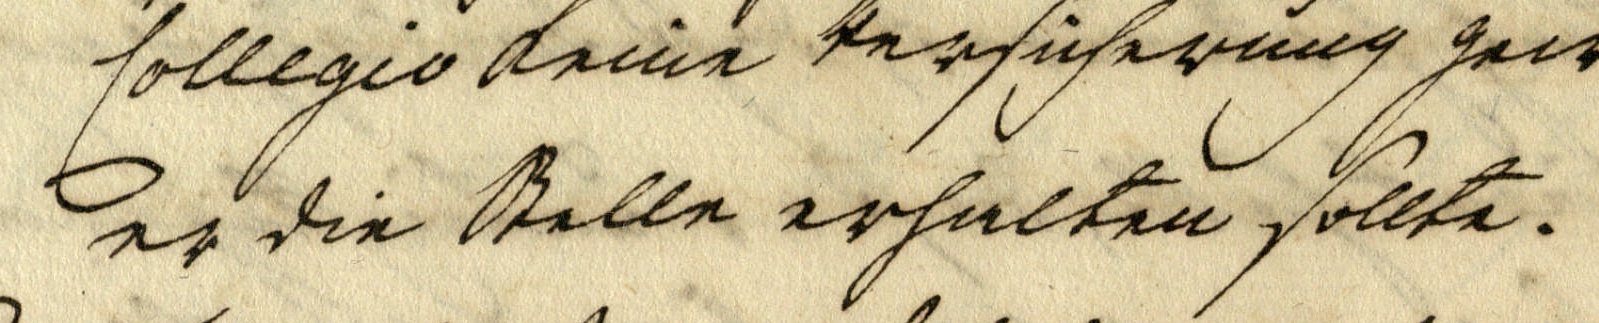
er die Stelle erhalten sollte.
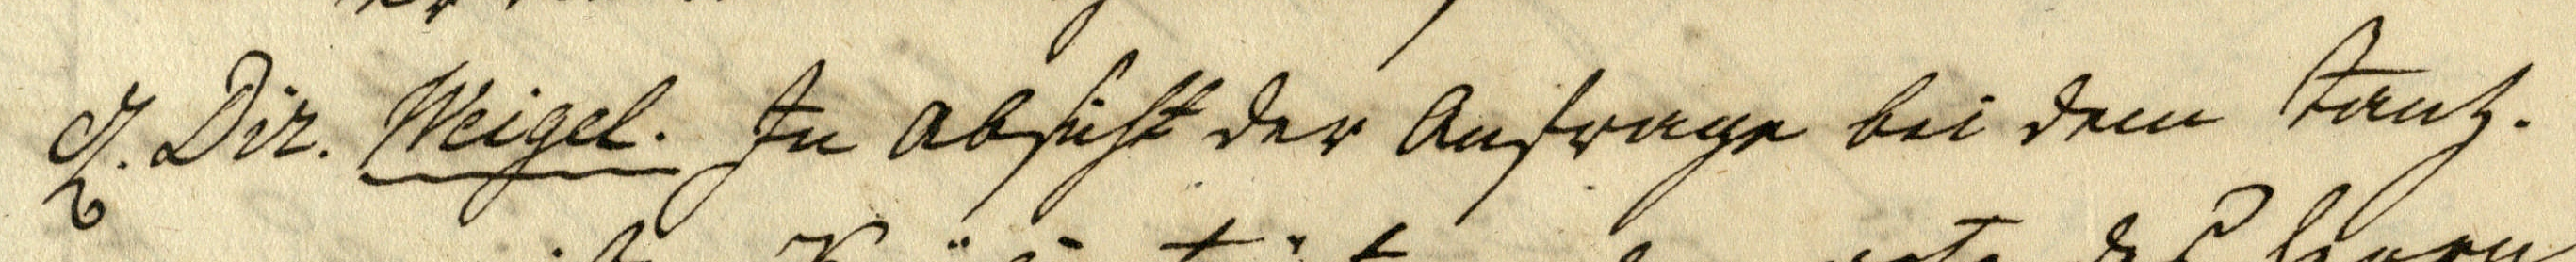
dh. Dir. Weigel. In Absicht der Anfrage bei dem Tanz-
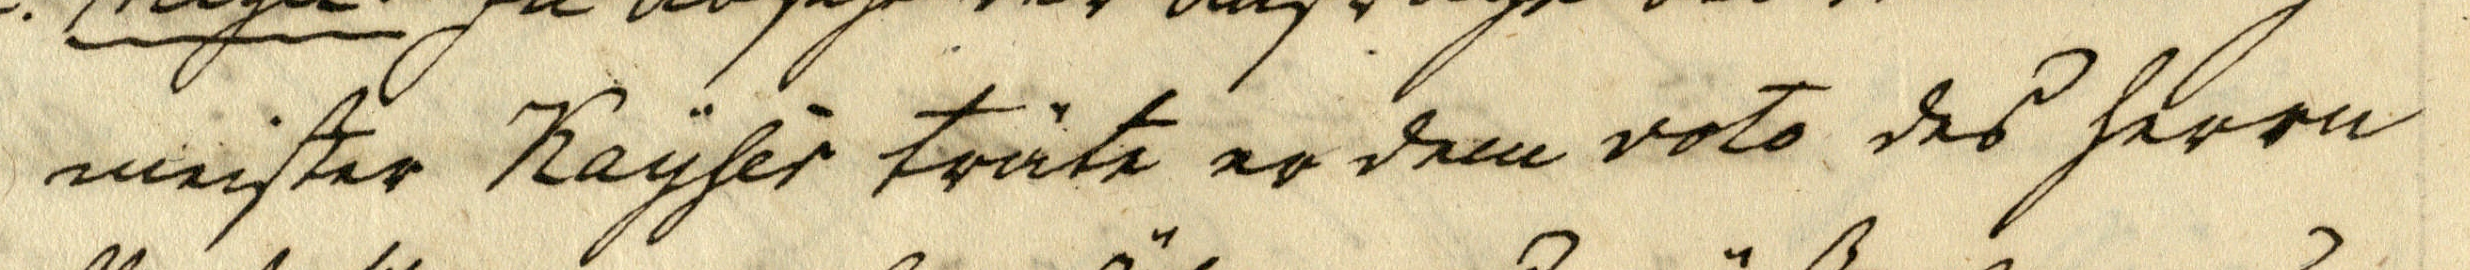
meister Kayser träte er dem voto des herrn
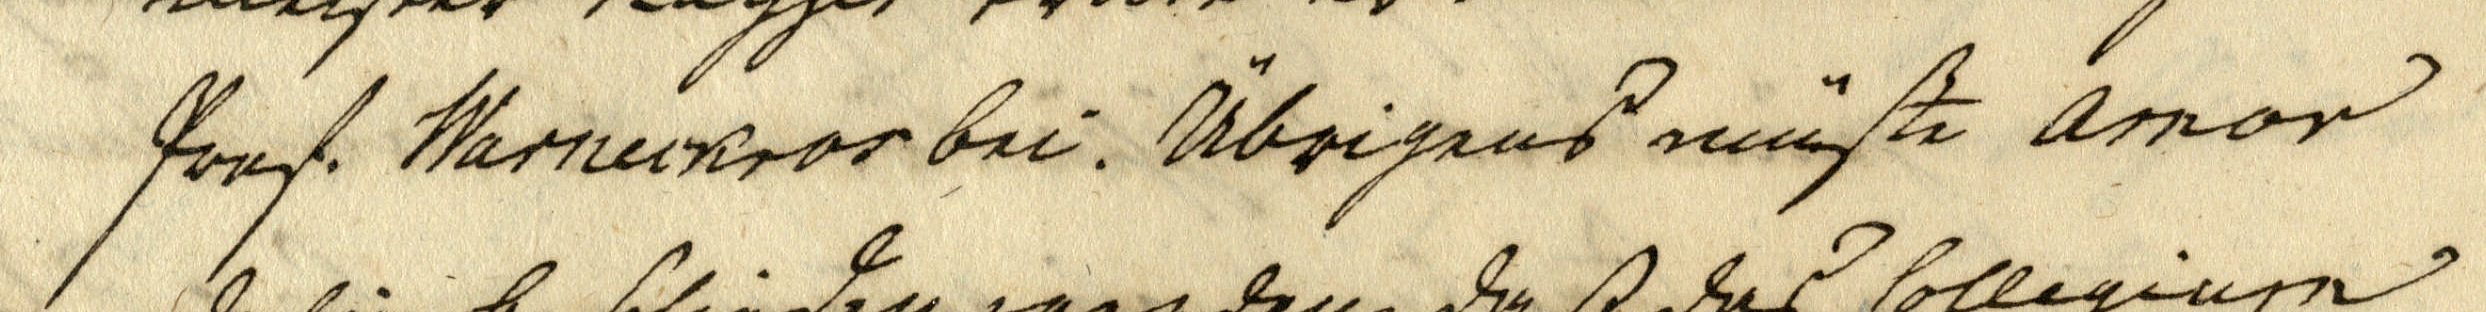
Prof. Wanreckros bei. Übrigens müßte Amor
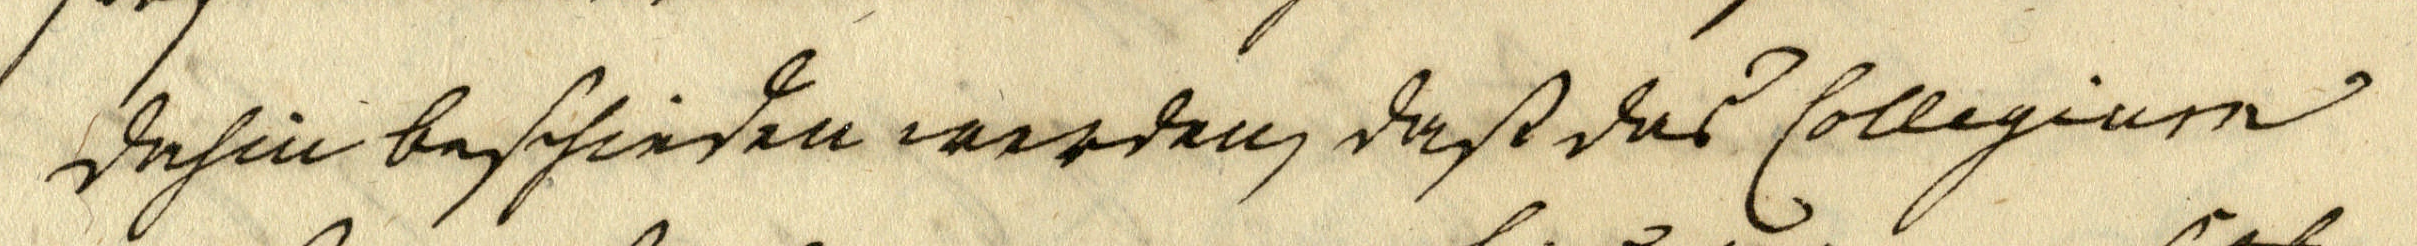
dahin beschieden werden, daß das Collegium
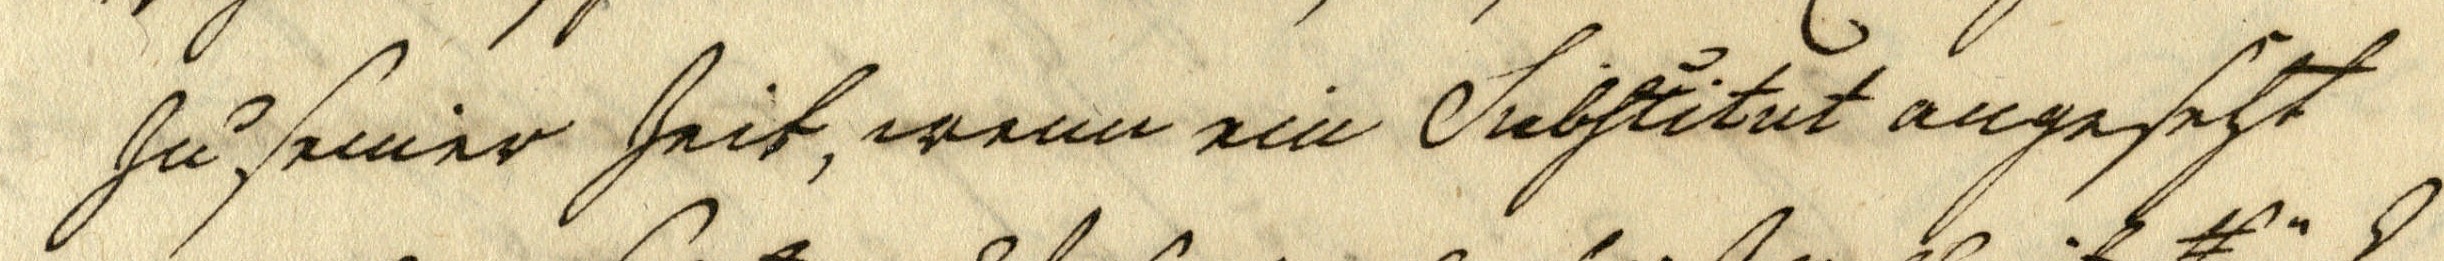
zu seiner Zeit, wenn ein Substitut angesetzt
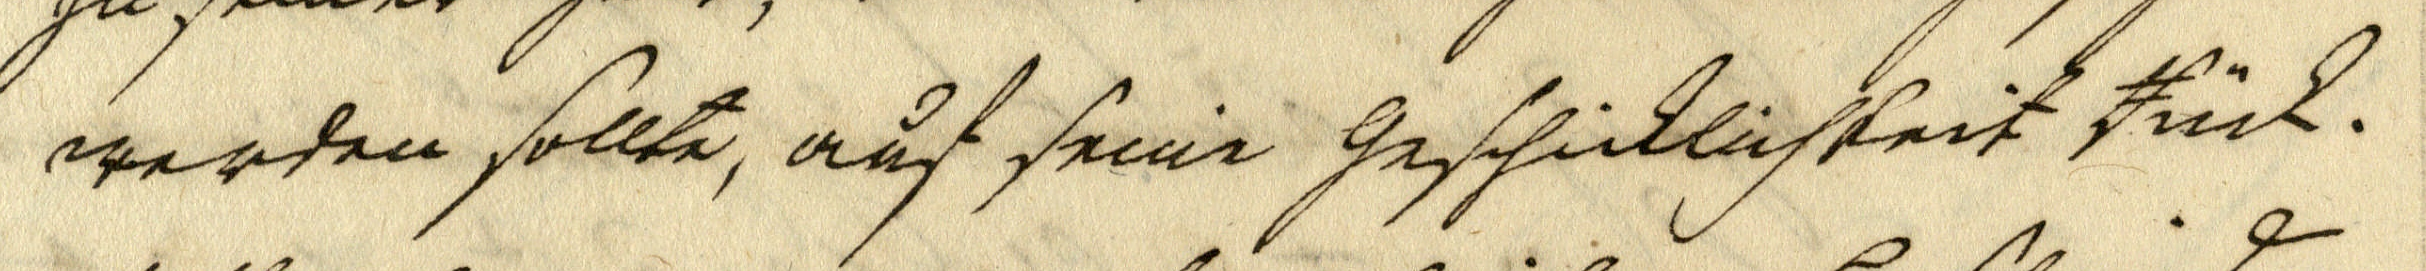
werden sollte, auf seine Geschicklichkeit Rück-
